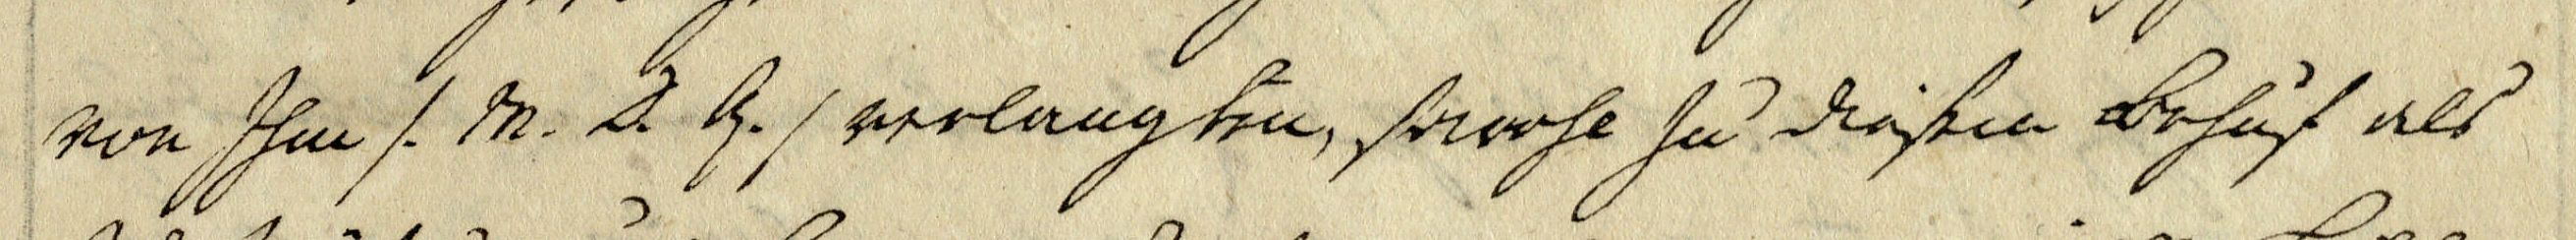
von Ihm /. M. D. R./ verlangten, sowohl zu diesem Behuf als
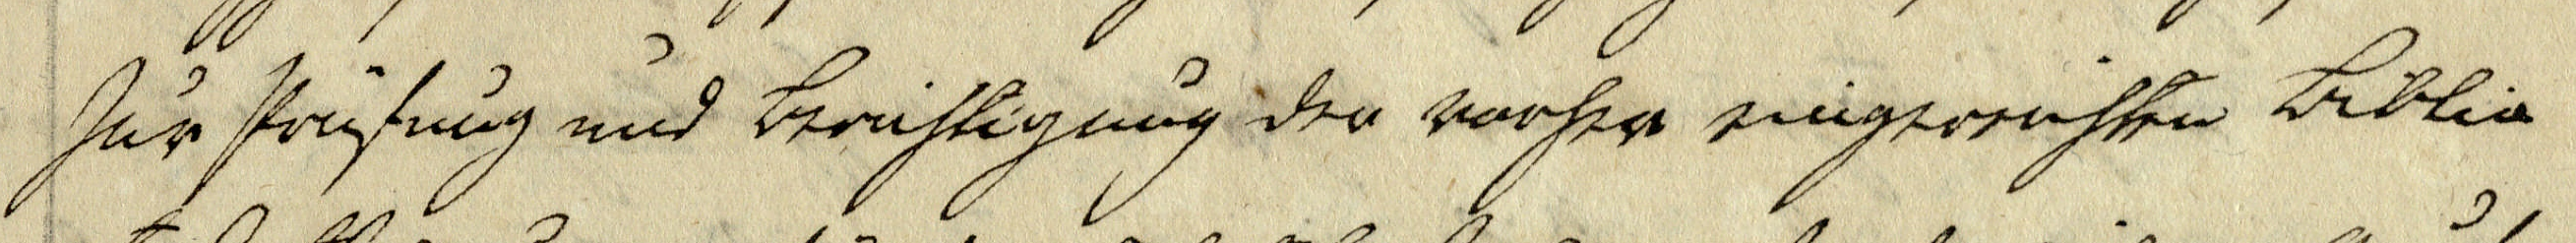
zur Prüfung und Berichtigung der vorher eingereichten Biblio¬
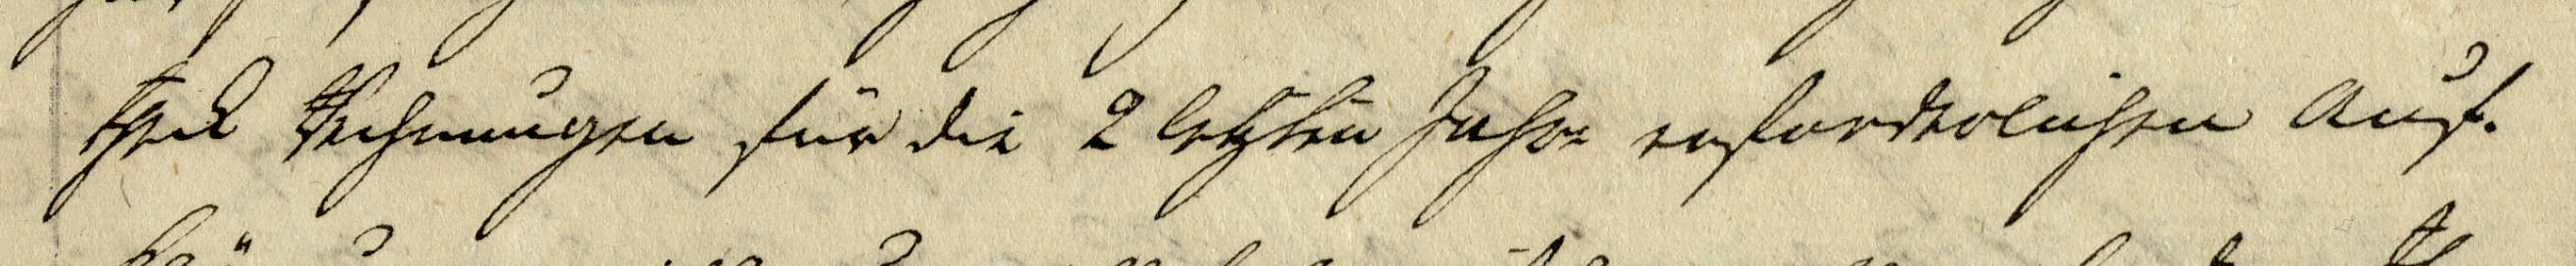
thek Rechnungen für die 2 letzten Jahre erforderlichen Auf¬
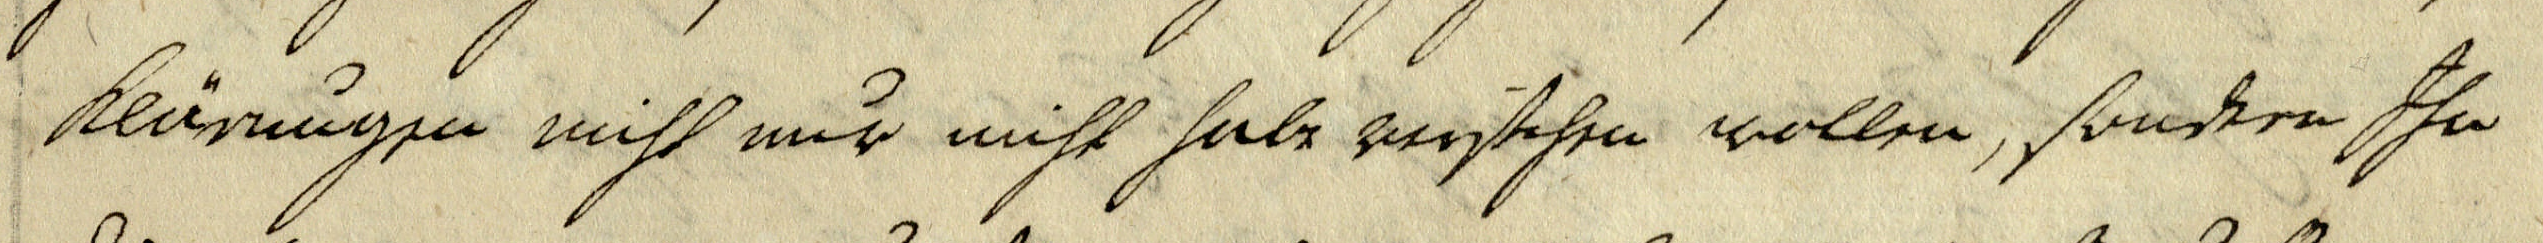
klärungen nicht nur nicht habe verstehen wollen, sondern Ihn
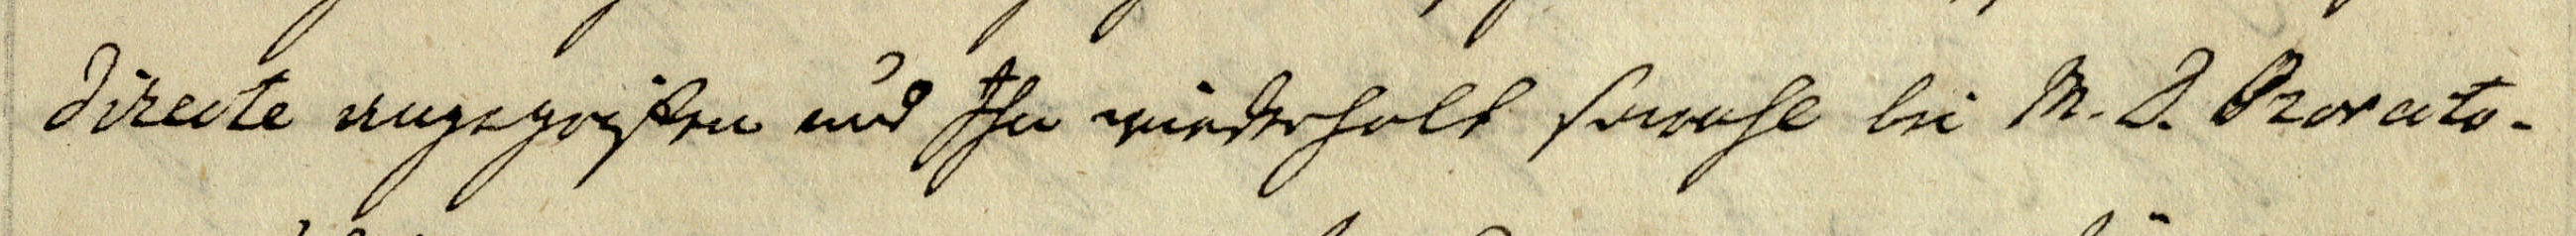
directe angegriffen und Ihn wiederholt sowohl bei M. D. Prorecto¬
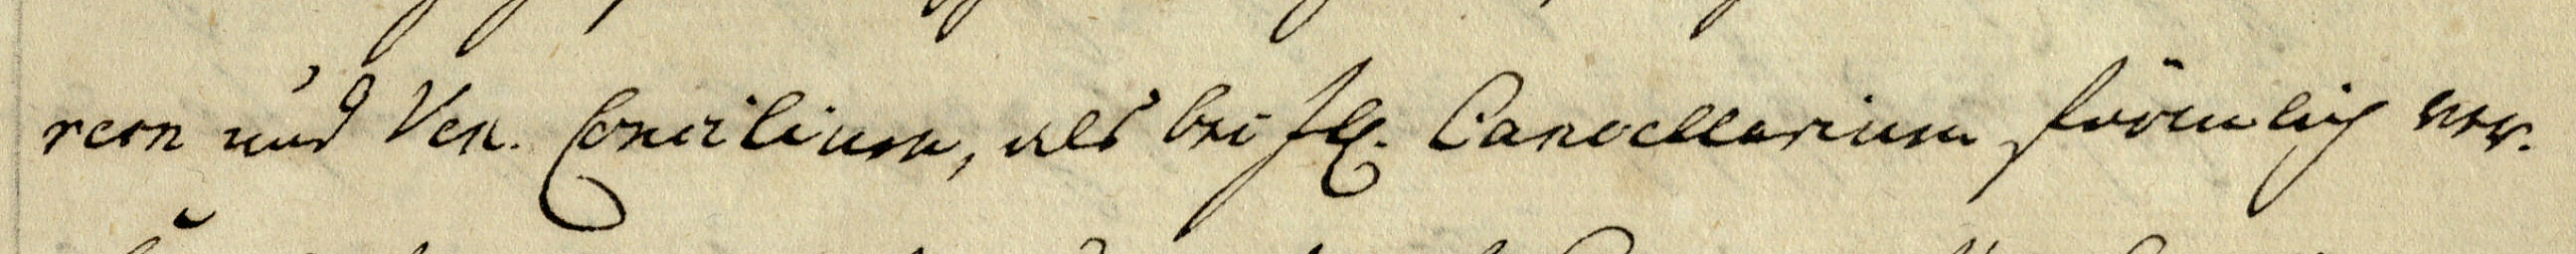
rem und Ven. Concilium, als bei Ill. Cancellarium förmlich ver¬
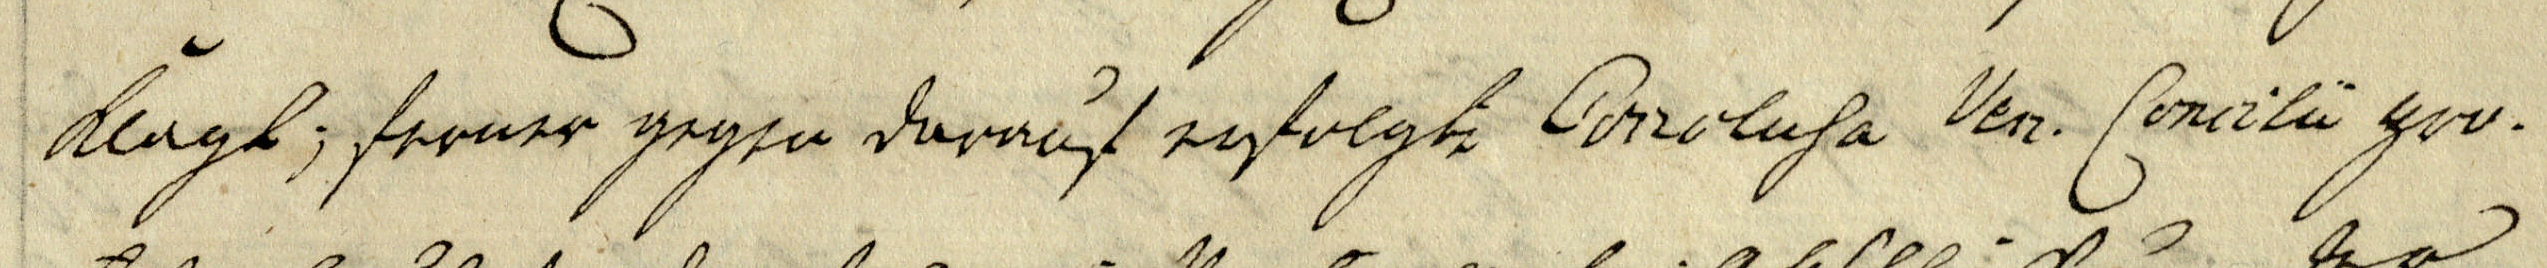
klagt; ferner gegen darauf erfolgte Conclusa Ven. Concilii pro¬
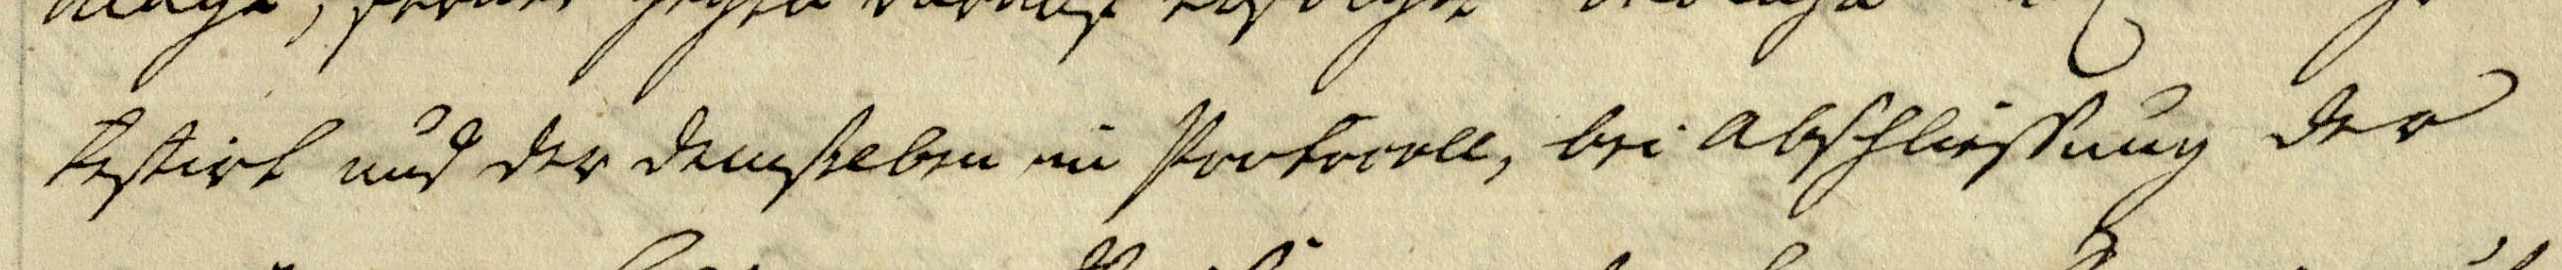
testirt und der demselben im Protocoll, bei Abschliessung der
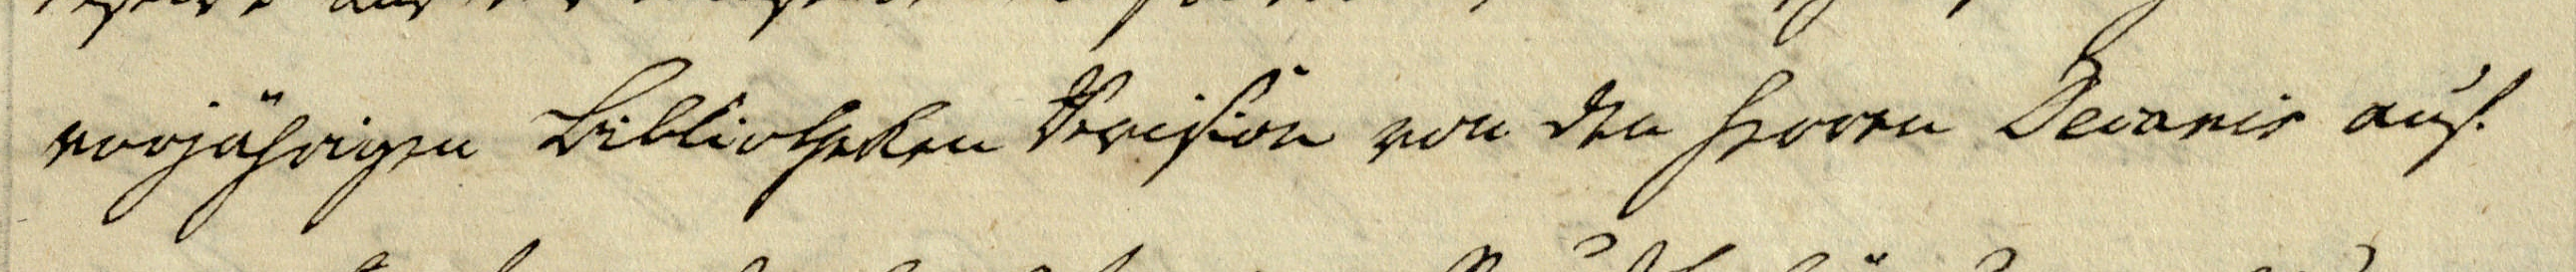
vorjährigen Bibliotheken Revision von den Herren Decanis auf¬
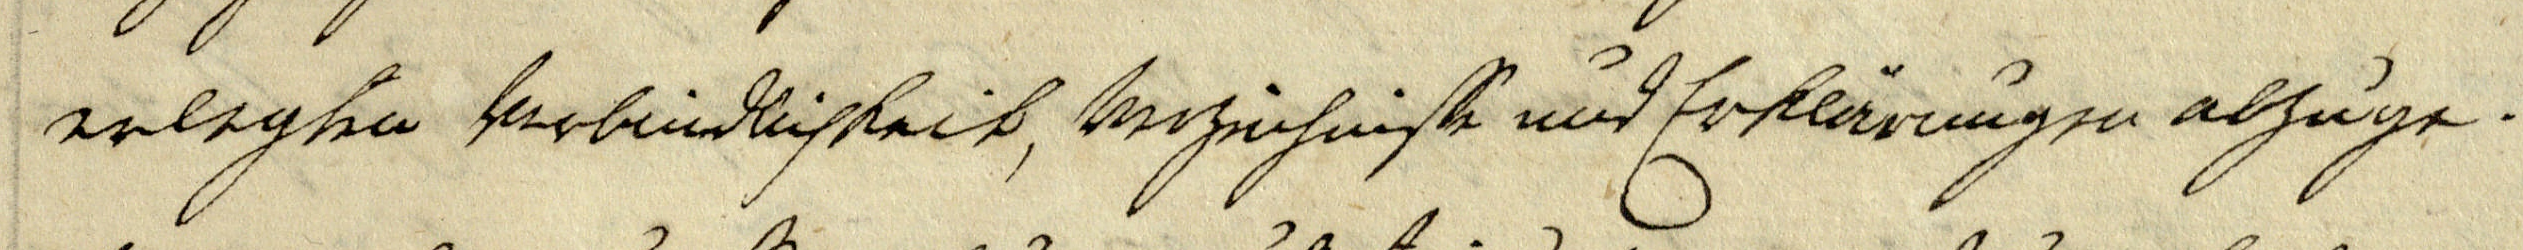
erlegten Verbindlichkeit, Verzeichnisse und Erklärungen abzuge¬
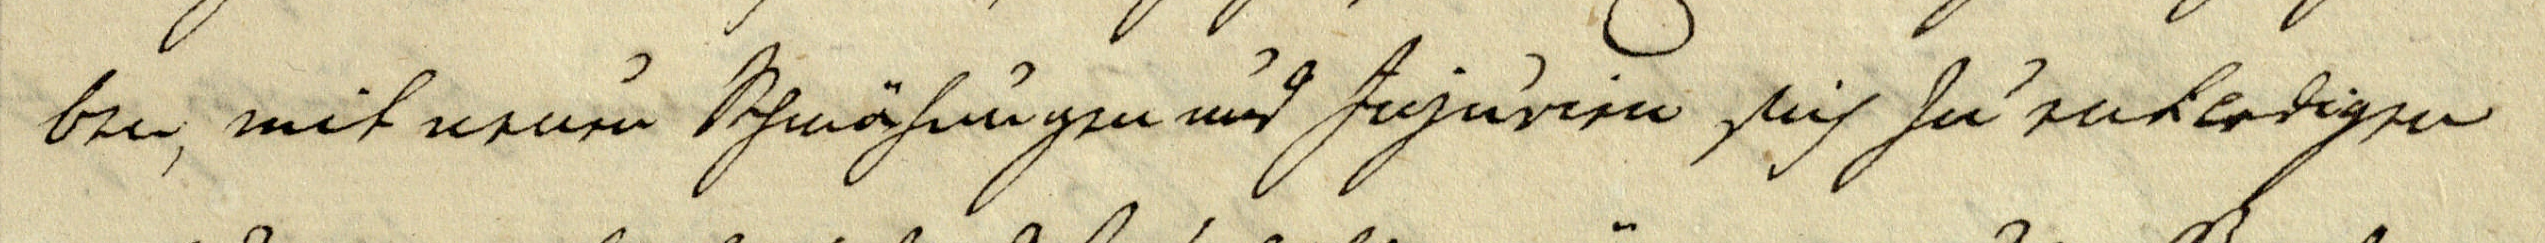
ben, mit neuen Schmähungen und Injurien sich zu entledigen
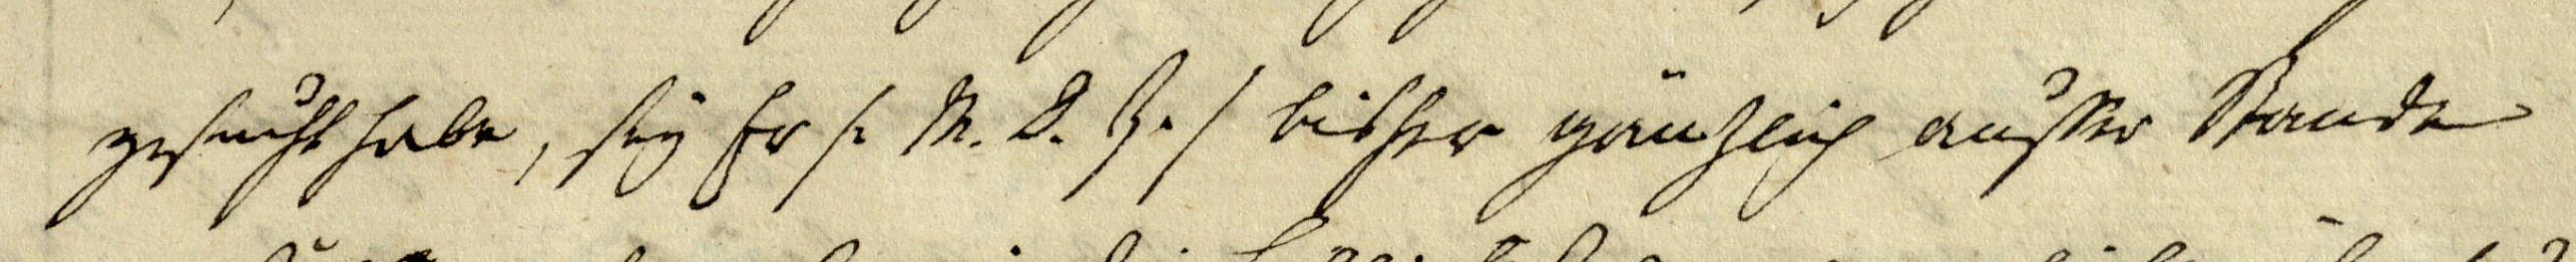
gesucht habe, seÿ Er /. M. D. R./ bisher gänzlich ausser Stande
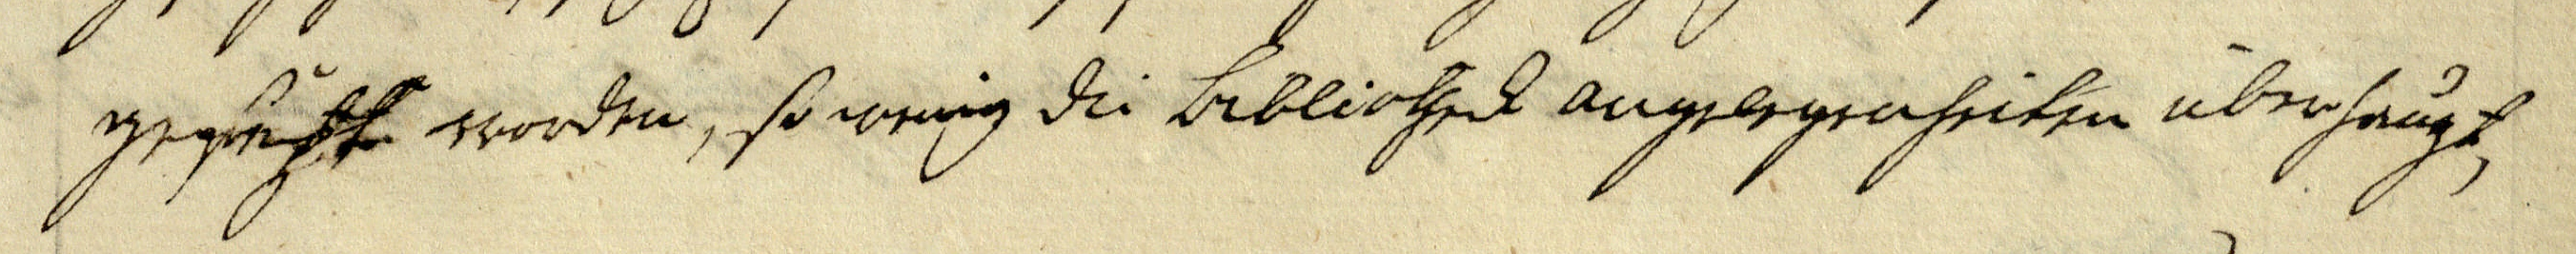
gesetzt worden, so wenig die Bibliothekangelegenheiten überhaupt,
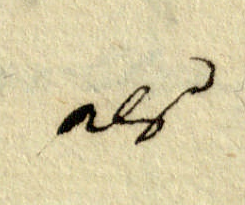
als
